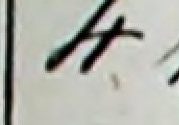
4
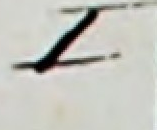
I
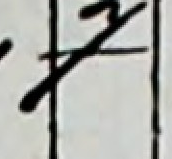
7
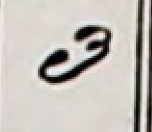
3
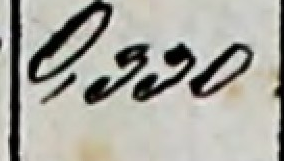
0,330
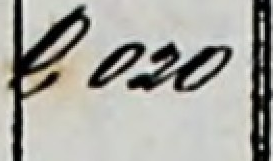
0,020
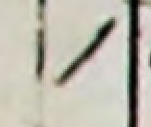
1
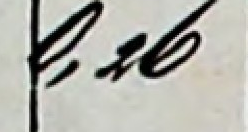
0,26
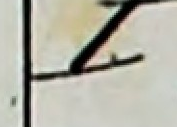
I
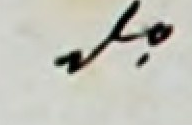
do
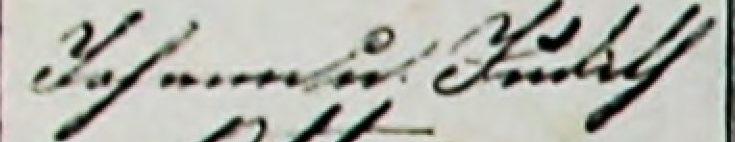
Johann u. Judith
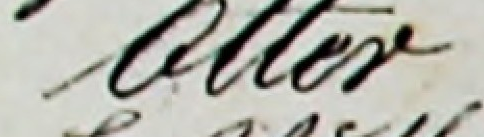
Otter
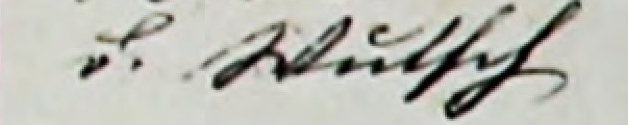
v. Wutsch
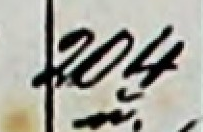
204
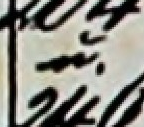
u.
